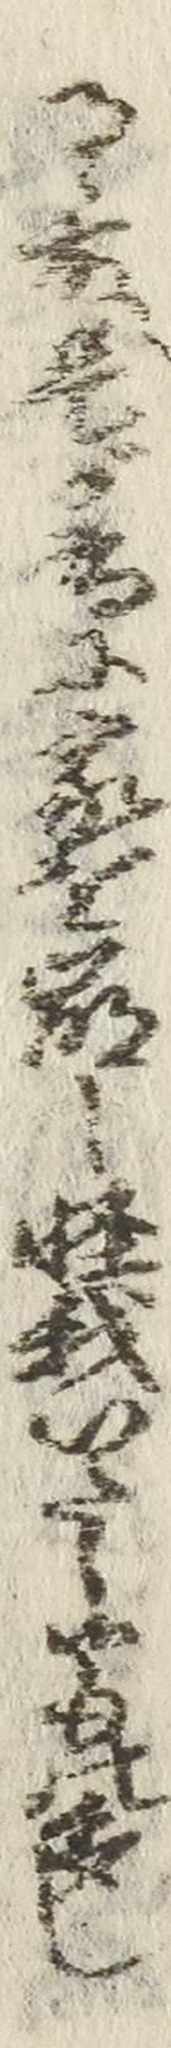るゝ故是が為に家を崩し怪我いたし候もの多し
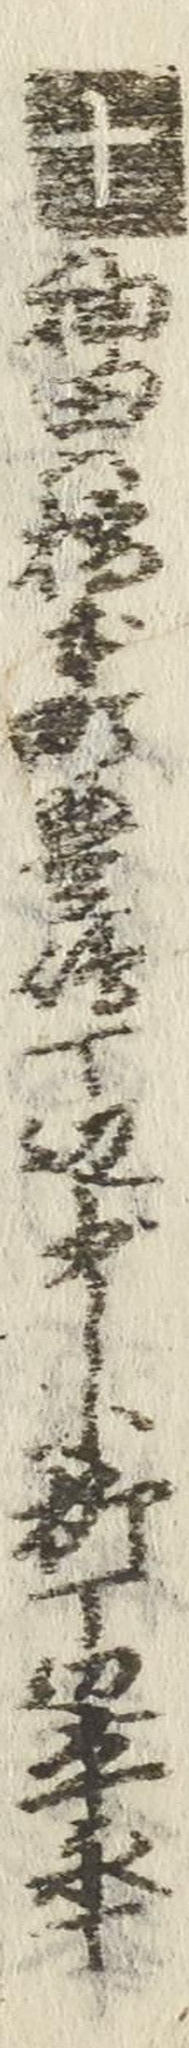十神田は橋本町豊島丁辺少し小柳丁辺平永丁
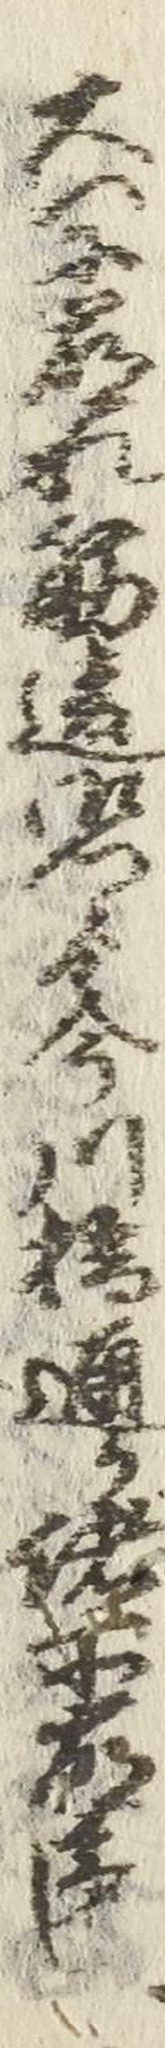大いに崩れ筋違御門ゟ今川橋通り諸所崩多し
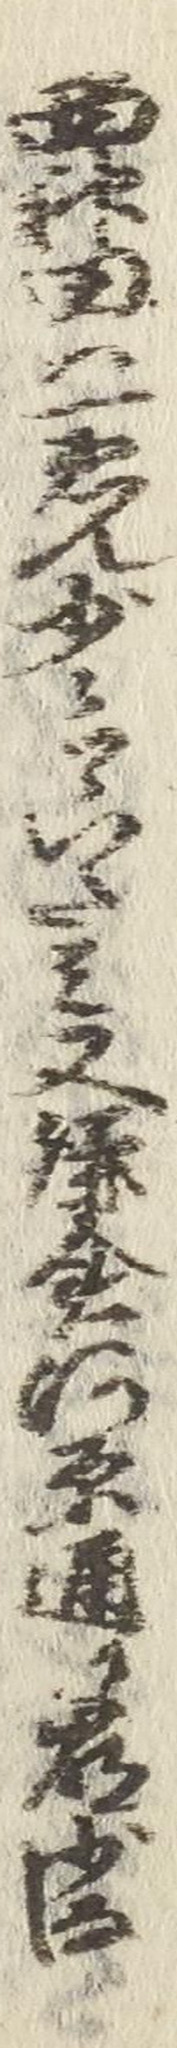西神田は一ゑん少々ツゝいたみ又鎌倉河原通り崩少なし
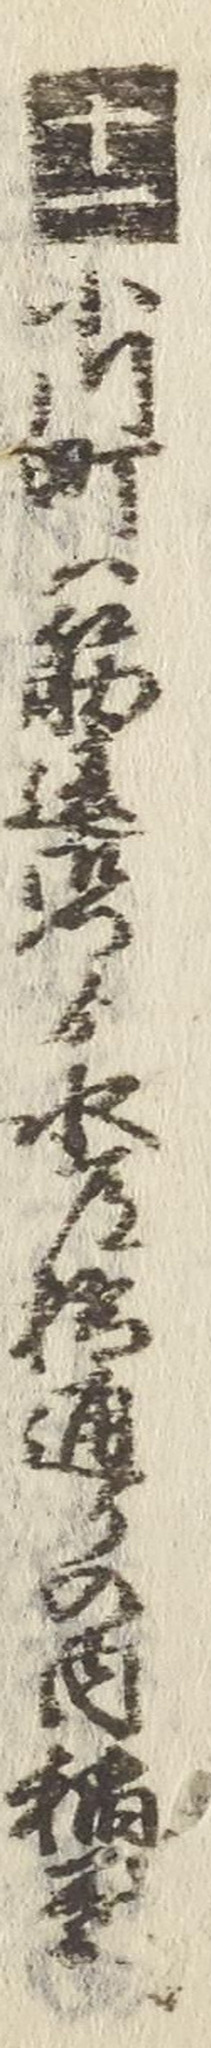十一小川町は違御門ゟ水道橋通りの内稲葉
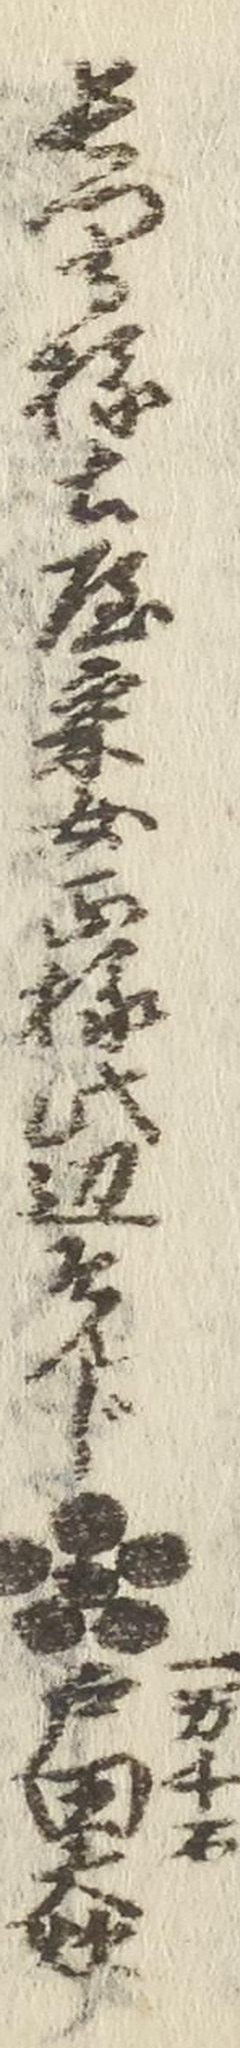長門守様土屋采女正様此辺そんじ一万千石戸田大炊
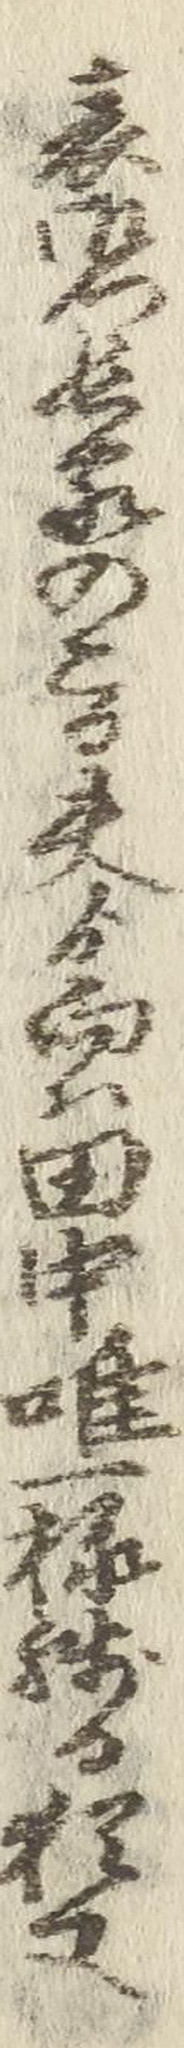表御門長家のこる夫ゟ向は田中唯一様残る猶又
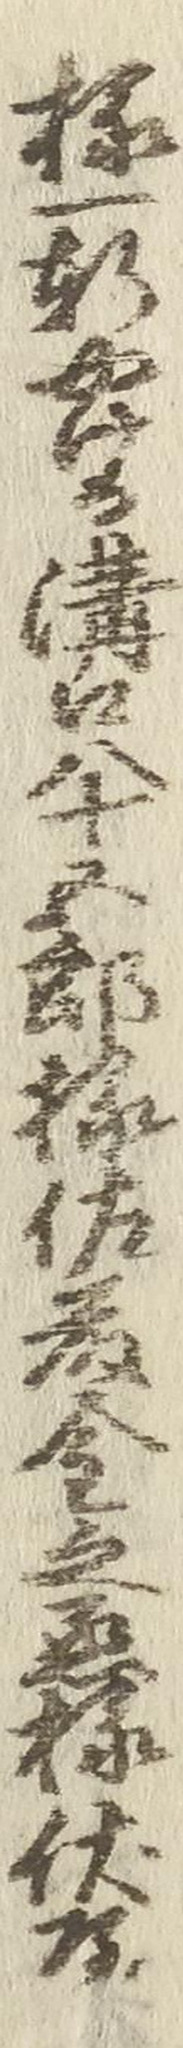様一軒やける溝口八十五郎様佐藤金之丞様伏屋
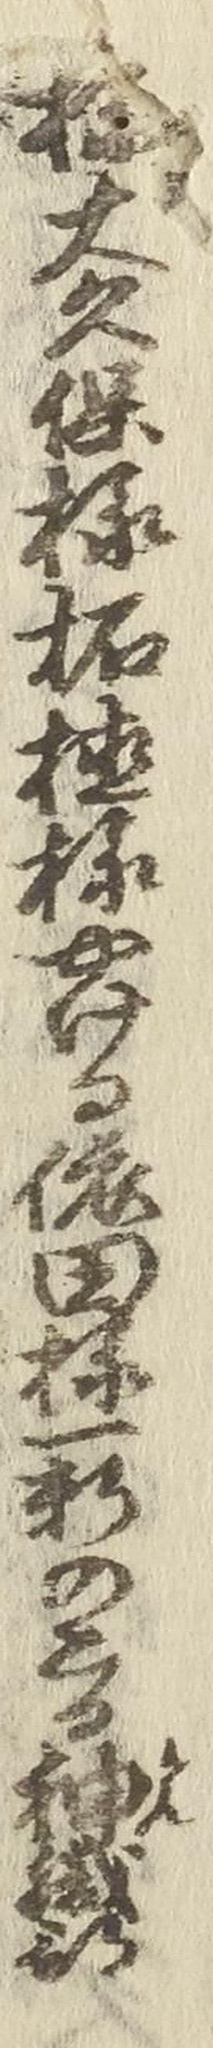様大久保様柘植様やける依田様一軒のこる神織部

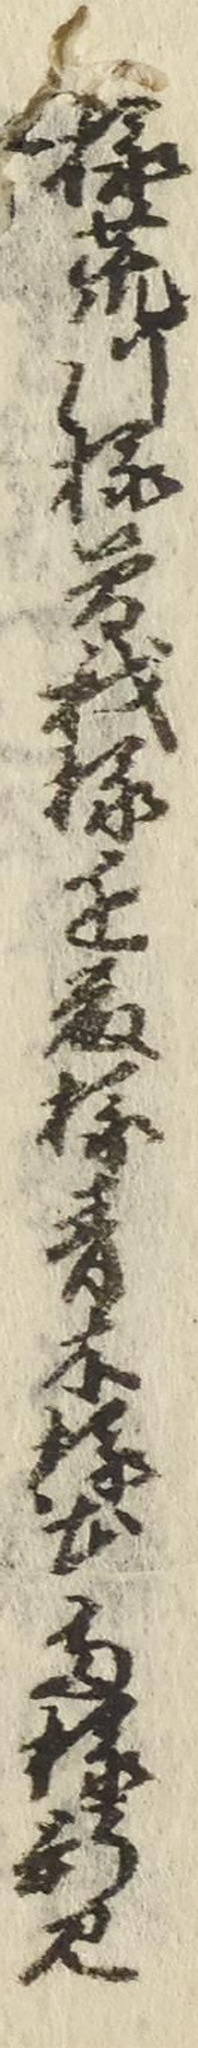様荒川様曽我様近藤様青木様本多様新見
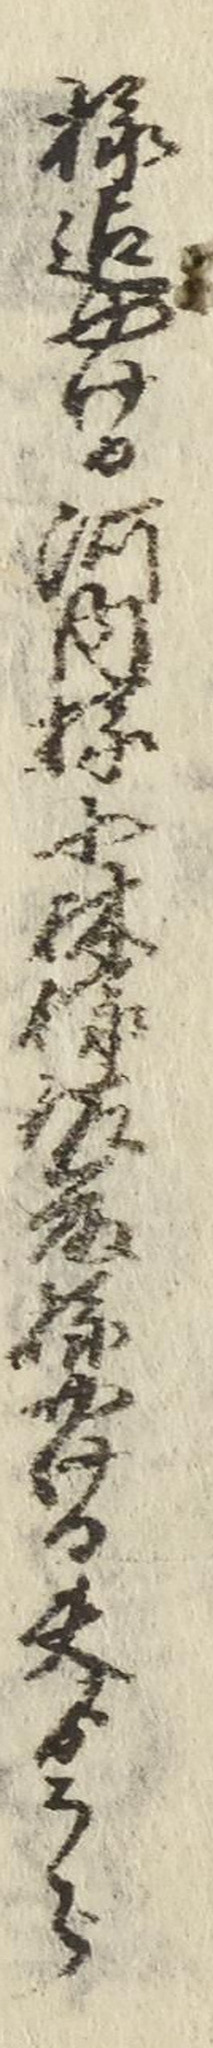様迄やける河内様小林様佐藤様やける夫ゟうら
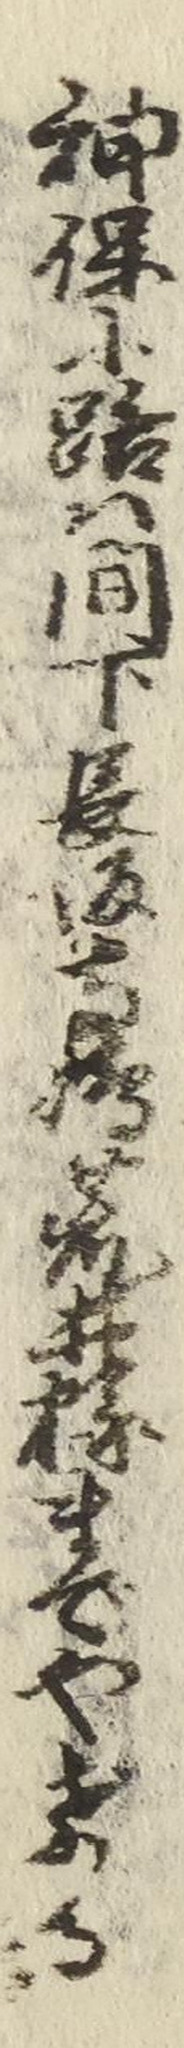神保小路は間下長坂寺嶋荒井様までやける
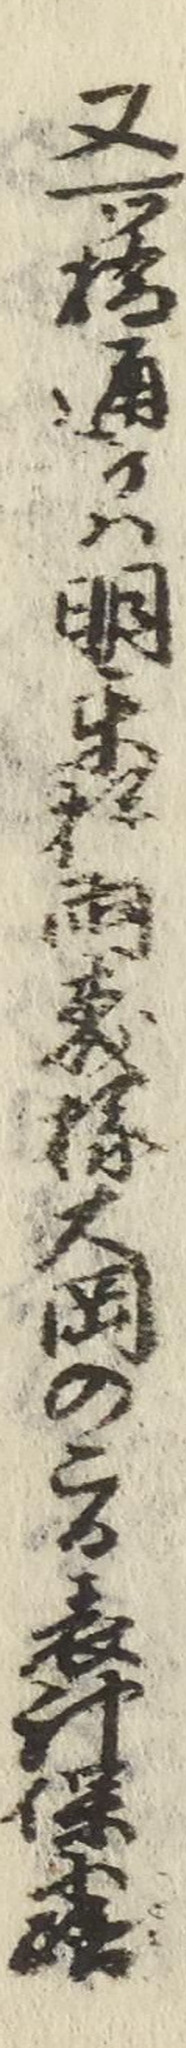又一ッ橋通りは明楽様雨森様大岡のこる表神保小路
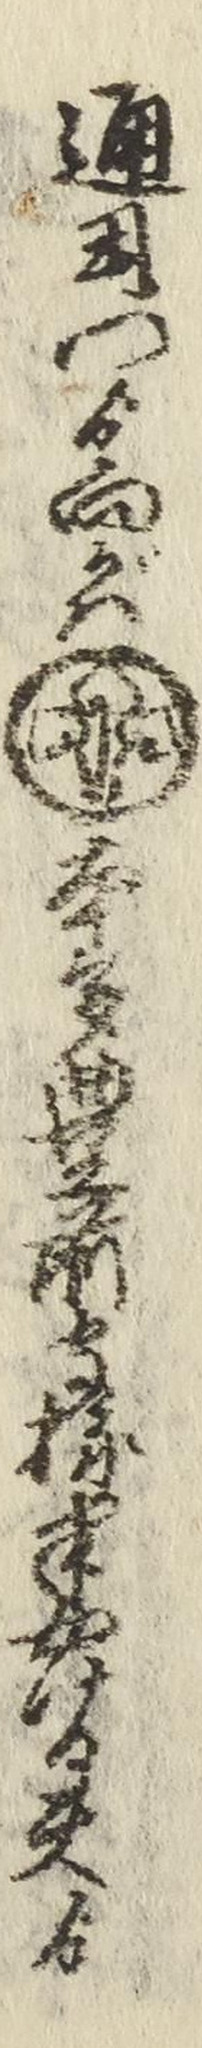通用門ゟ向がは本多豊前守様半やける夫ゟ
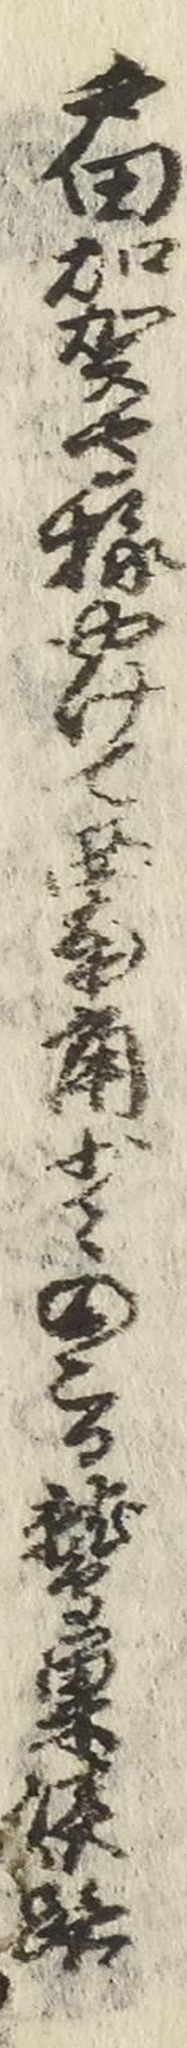戸田加賀守様やけて西南角少々のこる鷲巣淡路
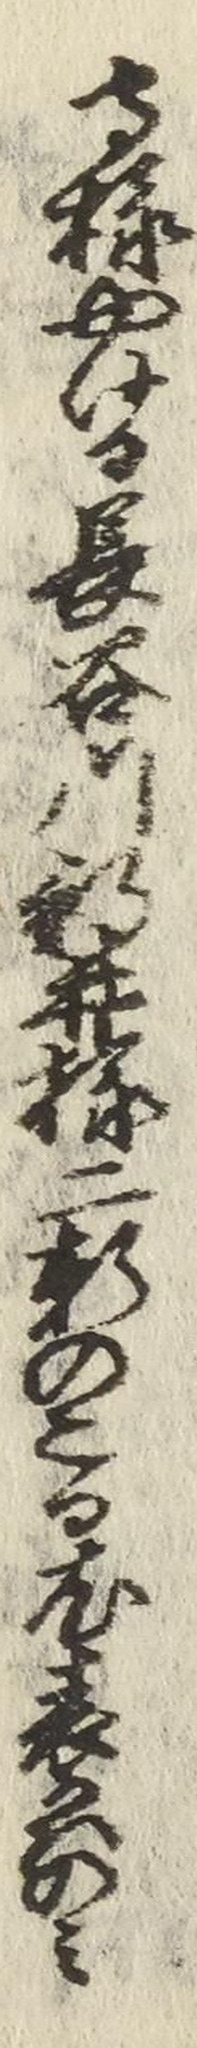守様やける長谷川新井様二軒のこる尤表かはのみ
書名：地震出火　男女死人怪我人書上之寫
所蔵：東京大学地震研究所図書室 Earthquake Research Institute Library, The University of Tokyo, JAPAN
